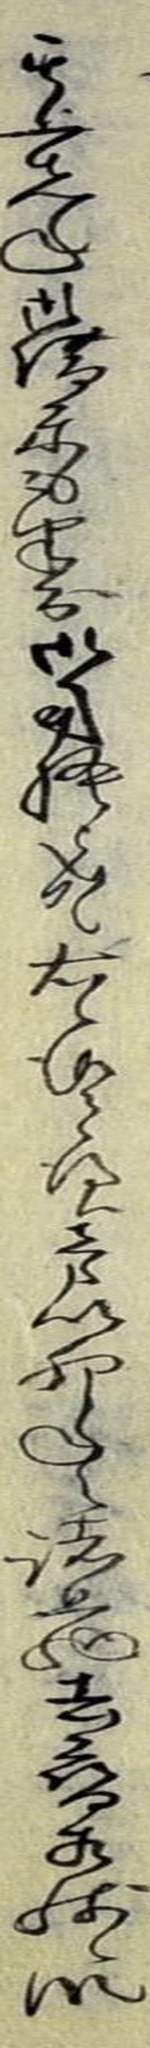其上先年御借米も半分御用捨被成候右之趣ニ候得ハ旁以卯年之諸上納去暮相残候段
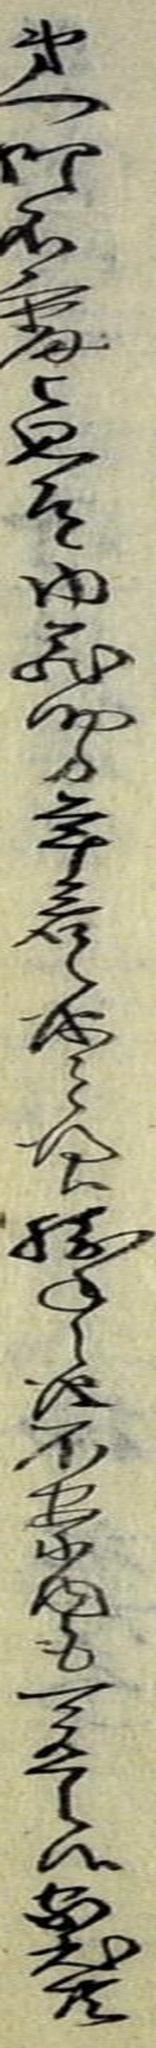第一御不審被思召候内蔵助方年若之儀ニ候得ハ勝手之儀不案内も可有之候家老共
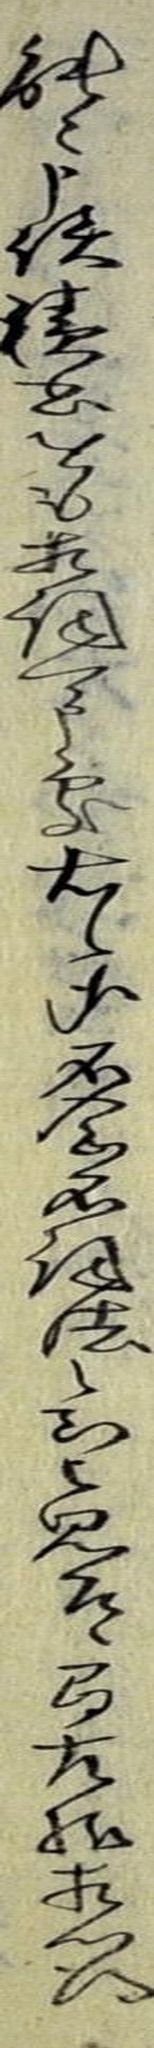能々申談積書をも相調可申処右之趣不念不調法之至被思召候間左様相心得
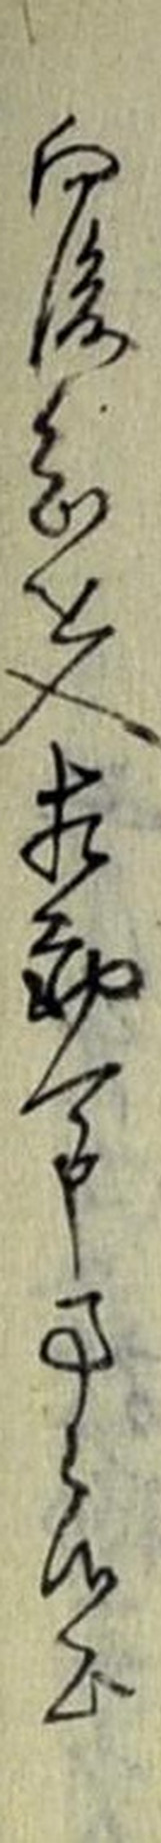向後念を入相勤可申事ニ候以上
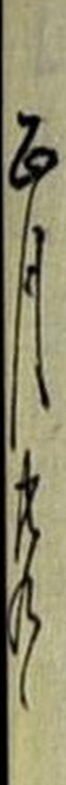正月廿九日
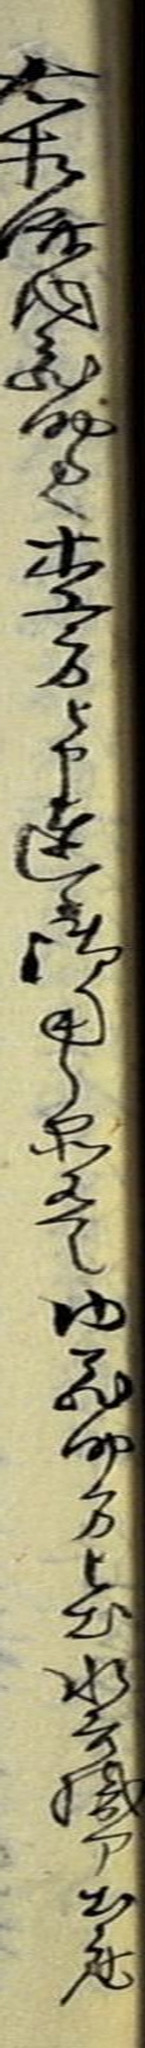右相済内蔵助方へ木工方被申達候御用之品有之内蔵助方被出水谷織部出座
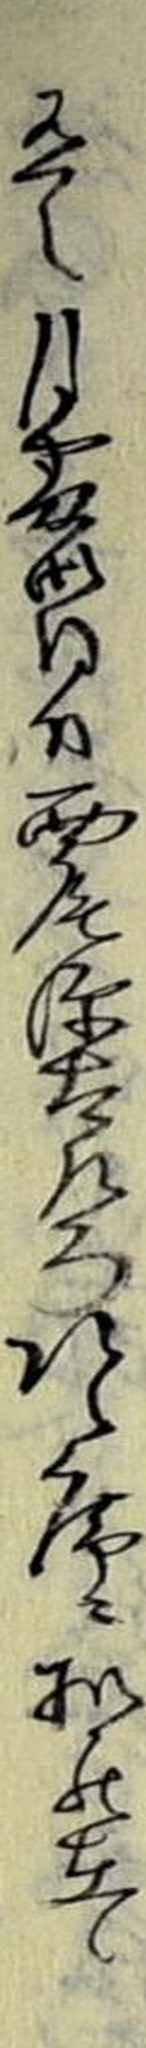有之月番御目付西尾源太左衛門次之席ニ控罷在候
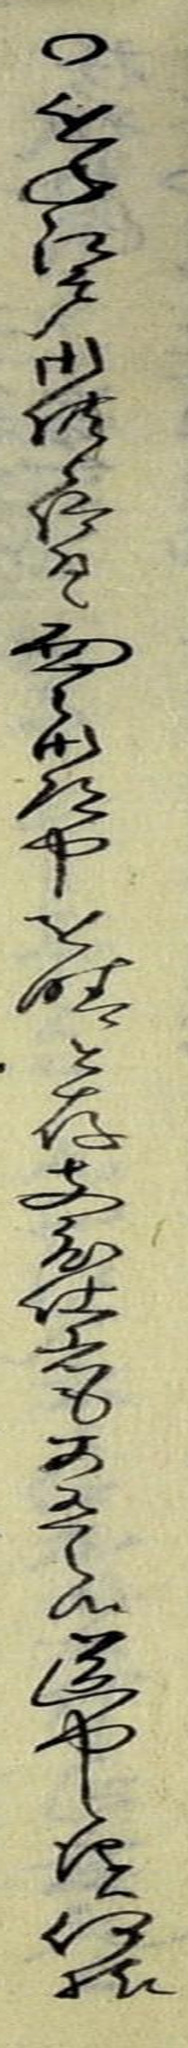〇近年江戸御供被仰付候面々御道中を晴と存支度仕者も可有之候道中之儀ハ何様
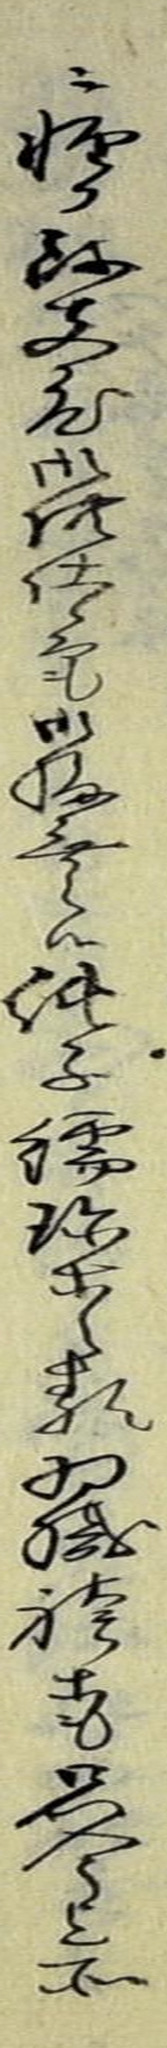ニ軽ク致支度御供仕候而も御構無之候純子繻珎等之類羽織袴等も只今迄所
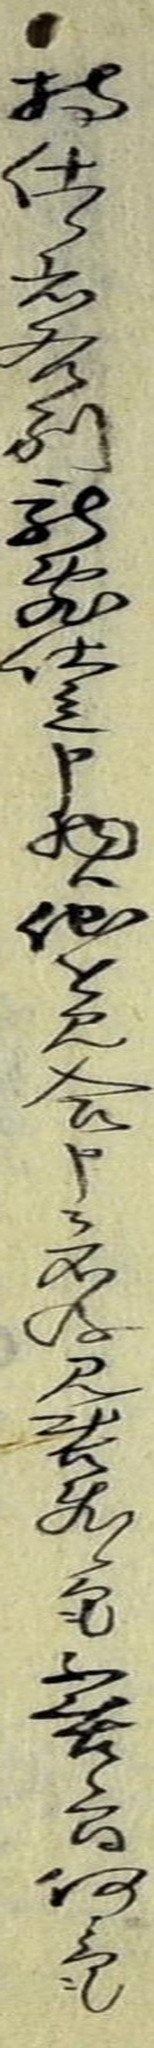持仕候者各別新敷仕立申物ハ他を見合申ニ不及見苦敷候而も不苦候間何ニ而も
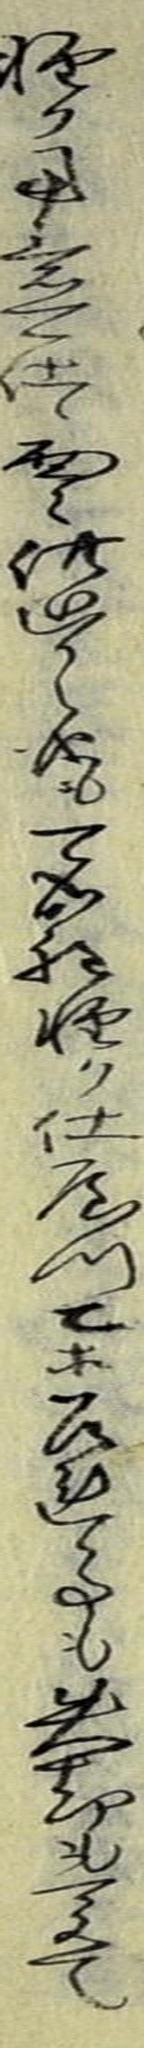軽ク用意可仕候面々供廻り之儀も可成程軽ク仕やつこ等召連候事も失却も可有之
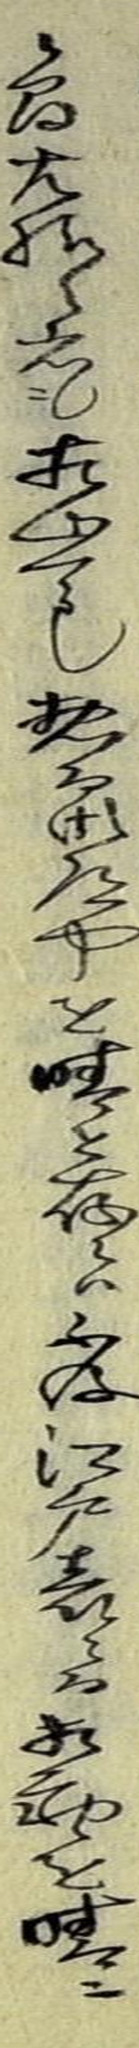候間左様之者も相止可申候惣而御道中を晴と存ニハ不及江戸表ニ而相勤候を晴ニ
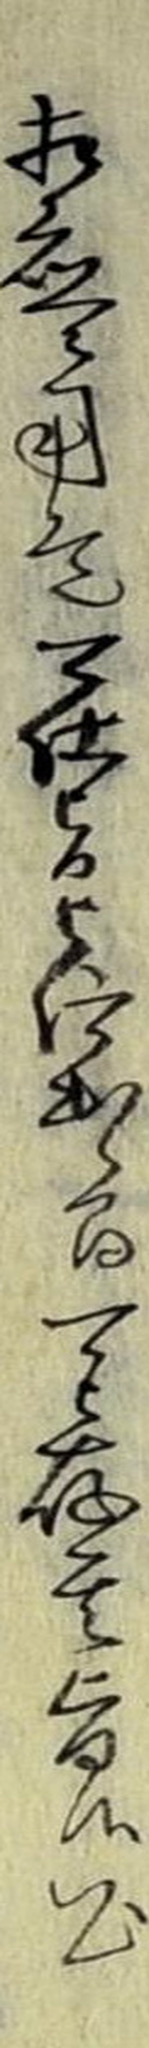相応ニ用意可仕旨被仰出候間可被存其旨候以上
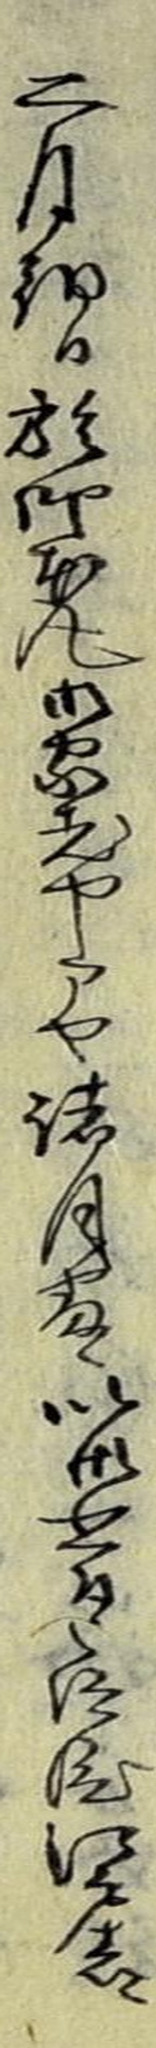二月朔日於御本丸御家老中部屋諸月番へ以御書付被仰渡江戸表へ
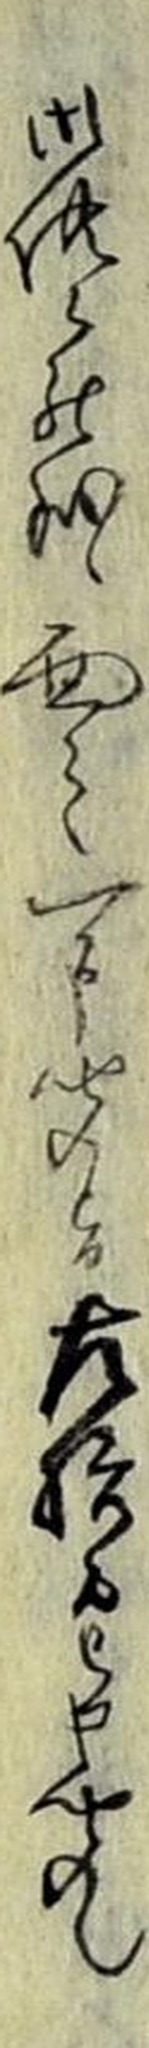御供ニ罷越候面々へ可申聞旨左膳方被申聞候
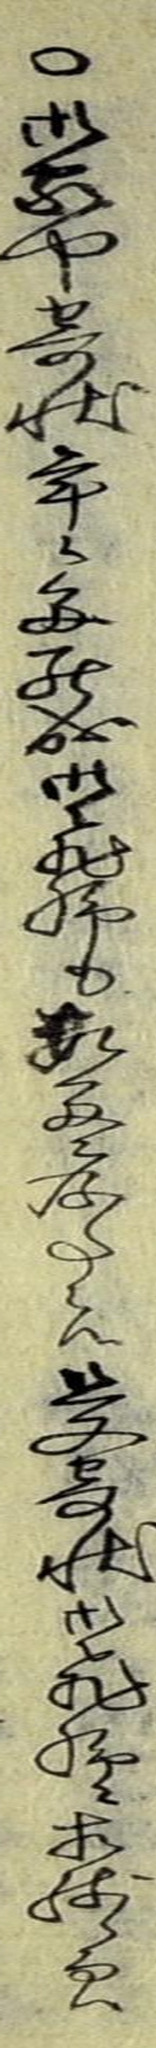〇御家中寄状年々多罷成御飛脚も数多ニ及事ニ候且又寄状御飛脚ニ相残候而ハ
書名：命令之部 一
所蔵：福井県文書館 Fukui Prefectural Archives
